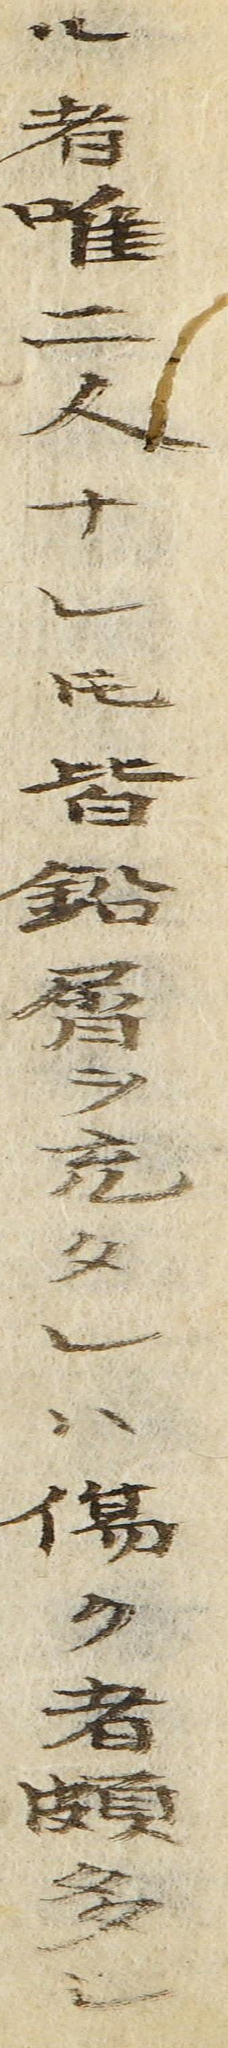ル者唯二人ナレトモ皆鉛屑ヲ充タレハ傷ク者頗多シ
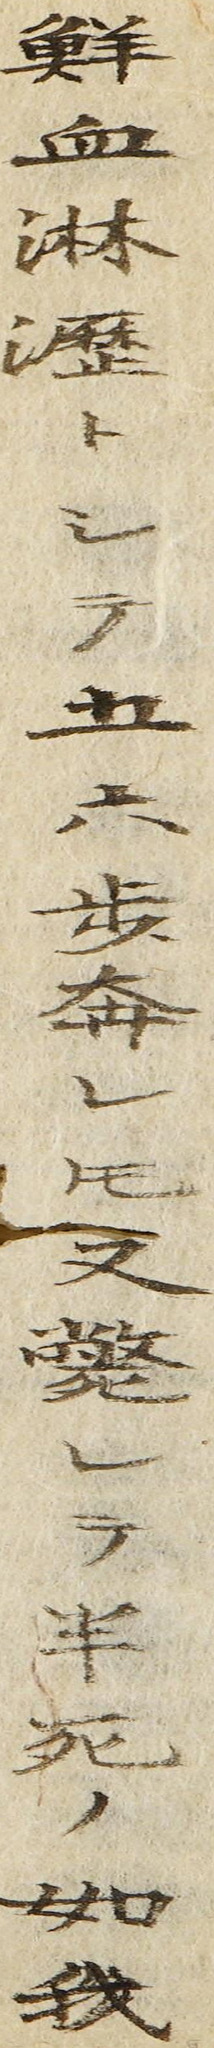鮮血淋瀝トシテ五六歩奔レトモ又斃レテ半死ノ如我
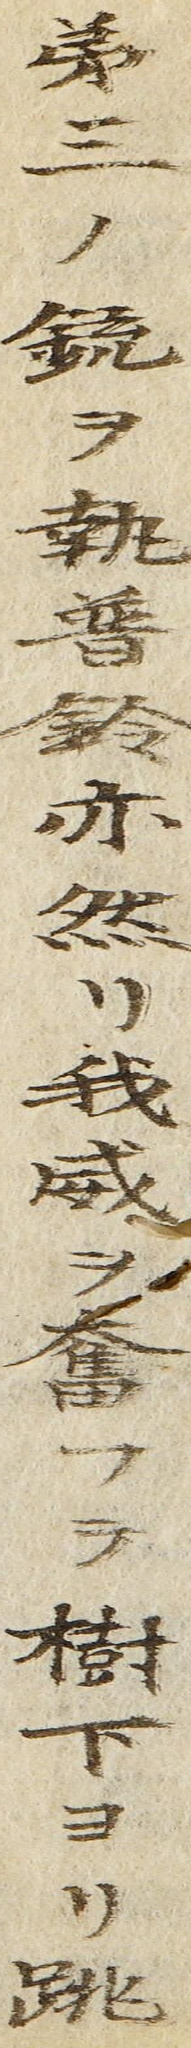第三ノ銃ヲ執普鈴亦然リ我威ヲ奮フテ樹下ヨリ跳
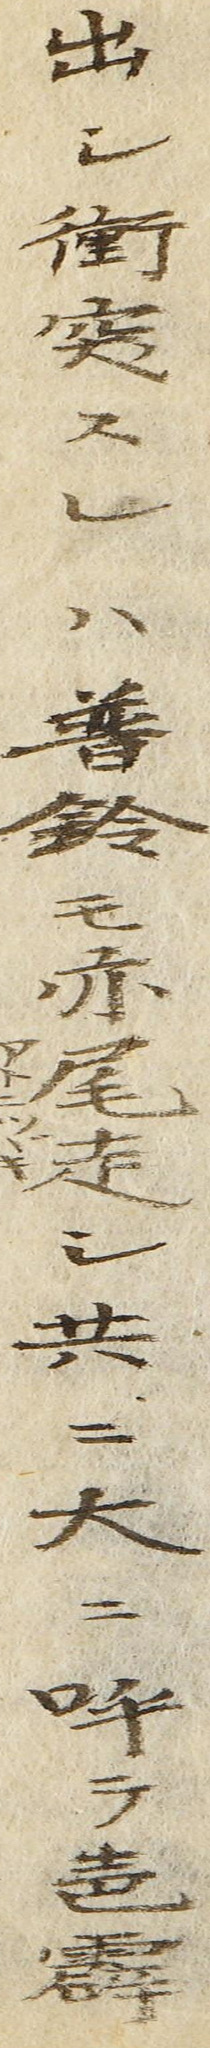出シ衝突スレハ普鈴モ亦尾走シ共ニ大ニ呼テ声霹
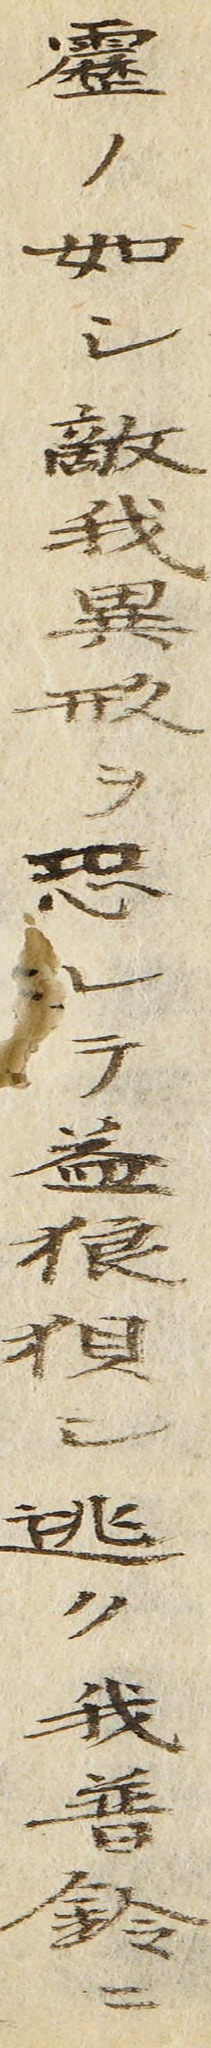靂ノ如シ敵我異形ヲ恐レテ益狼狽シ逃ク我普鈴ニ
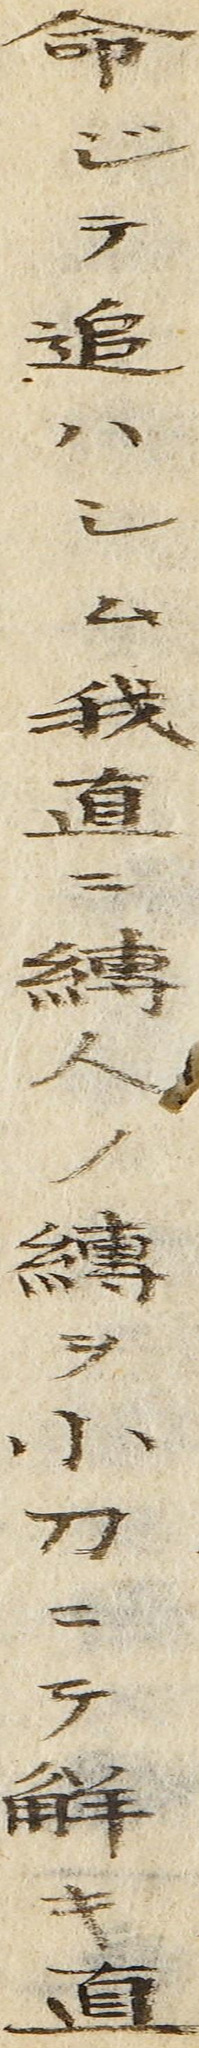命ジテ追ハシム我直ニ縛人ノ縛ヲ小刀ニテ解キ直
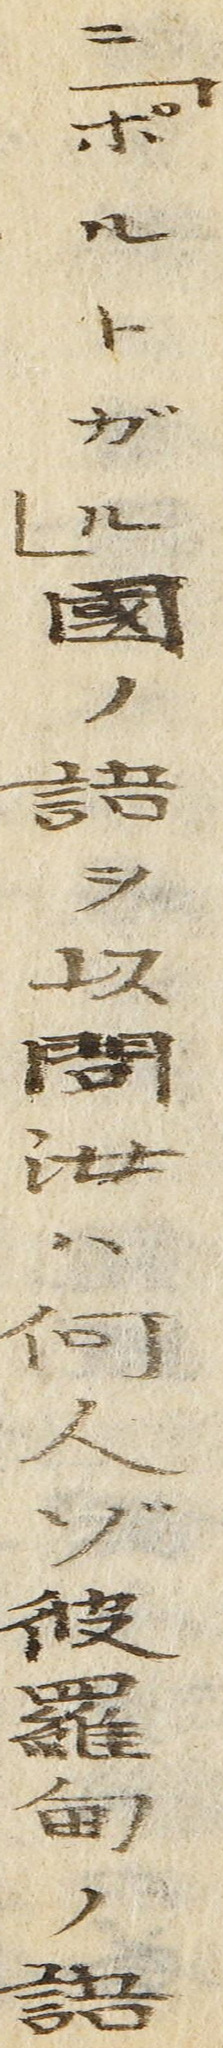ニ「ポルトガル」国ノ語ヲ以問汝ハ何人ゾ彼羅甸ノ語
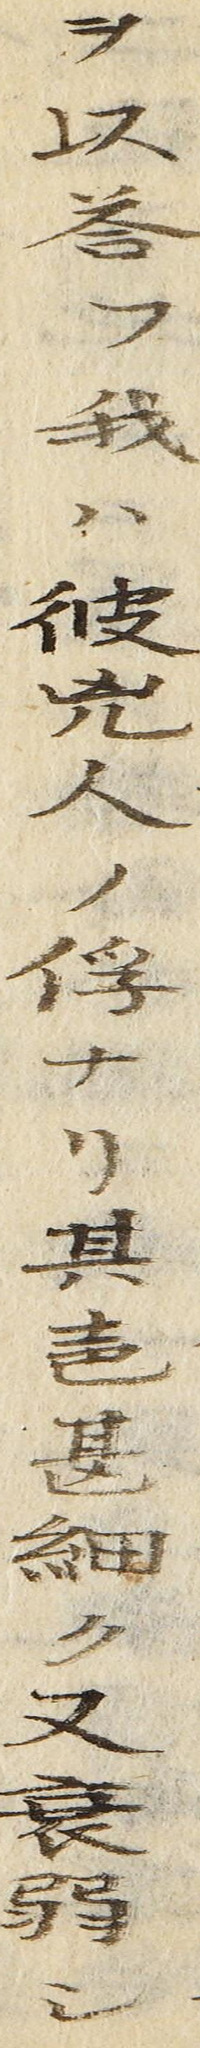ヲ以答フ我ハ兇人ノ俘ナリ其声甚細ク又衰弱シ
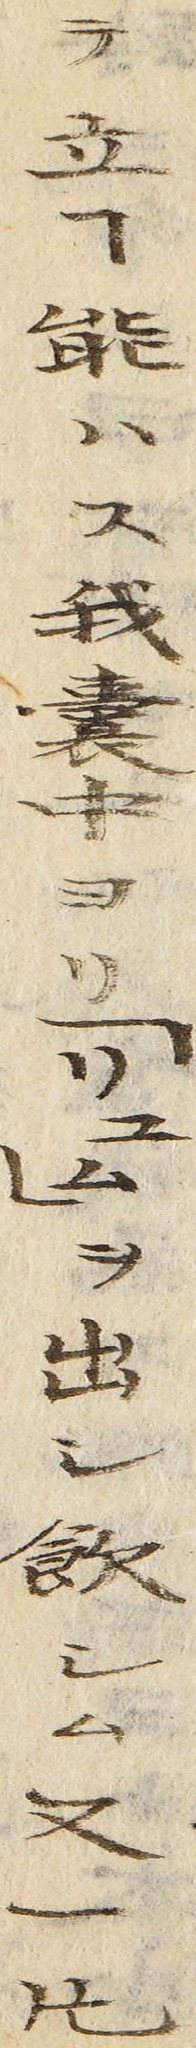テ立コト能ハス我嚢中ヨリ「リュム」ヲ出シ飲シム又一片
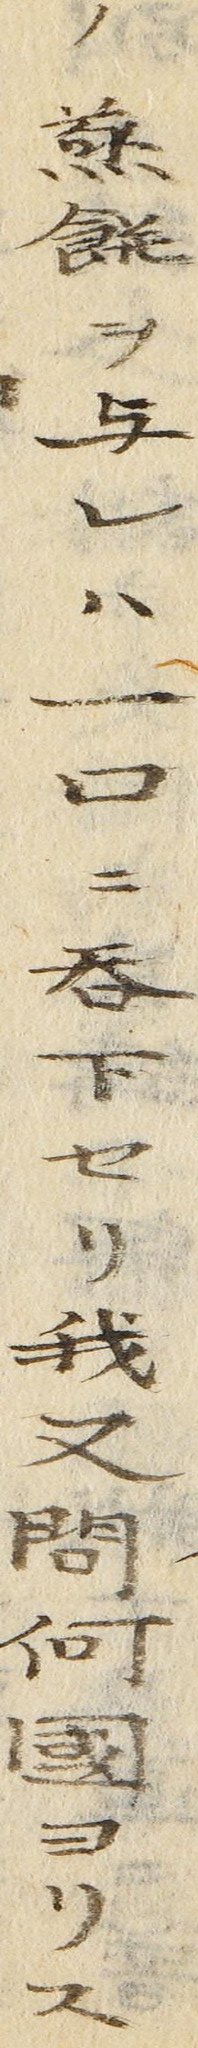ノ蒸餅ヲ与レハ一口ニ呑下セリ我又問何国ヨリス
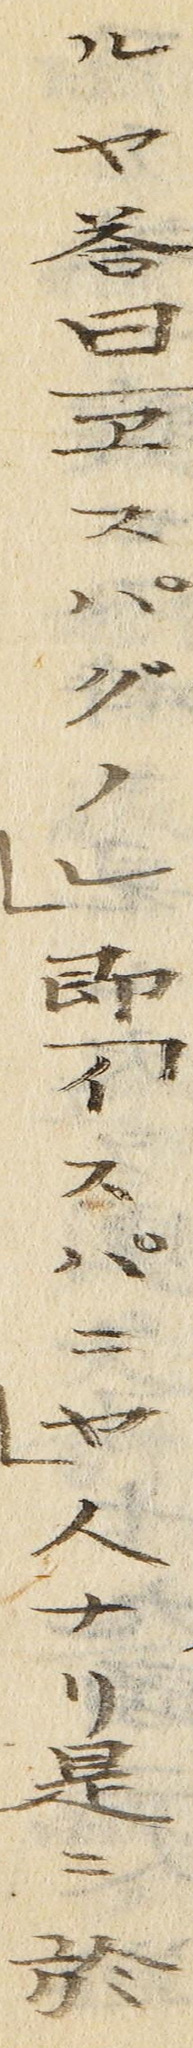ルヤ答曰「ヱスパグノレ」即「イスパニヤ」人ナリ是ニ於
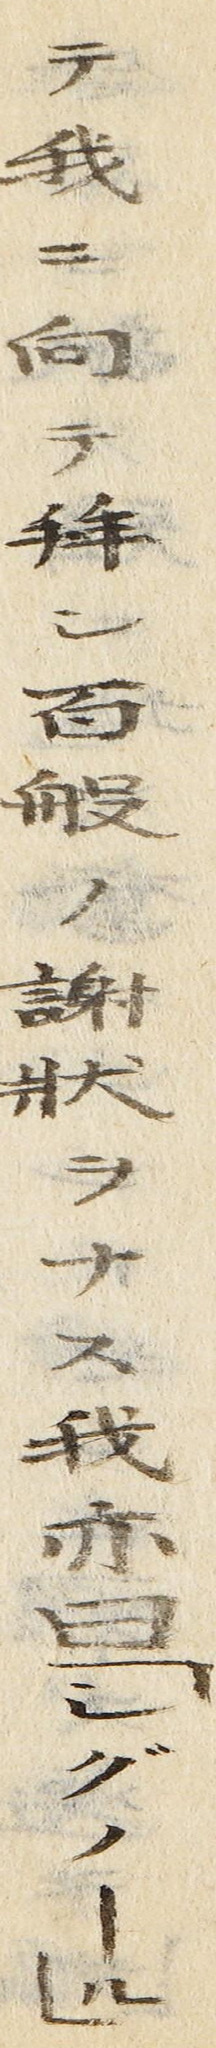テ我ニ向テ拝シ百般ノ謝状ヲナス我亦曰「シグノール」
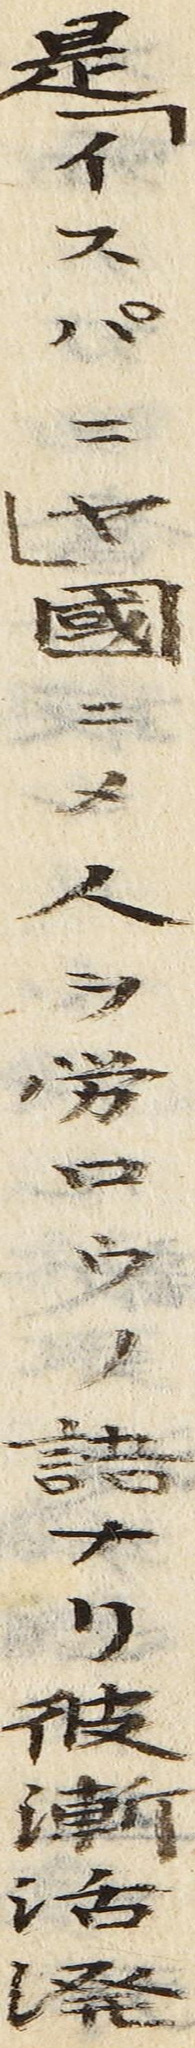是「イスパニヤ」国ニシテ人ヲ労ロウノ語ナリ彼漸活溌
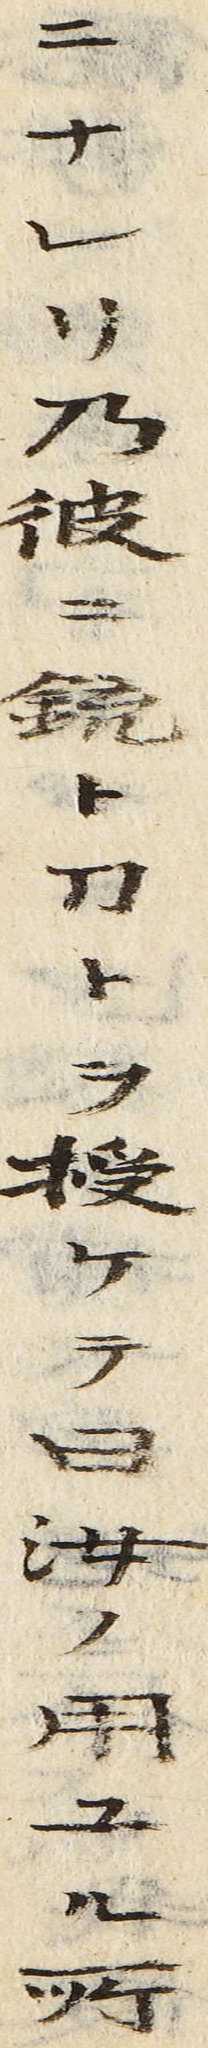ニナレリ乃彼ニ銃ト刀トヲ授ケテ曰汝ノ用ユル所
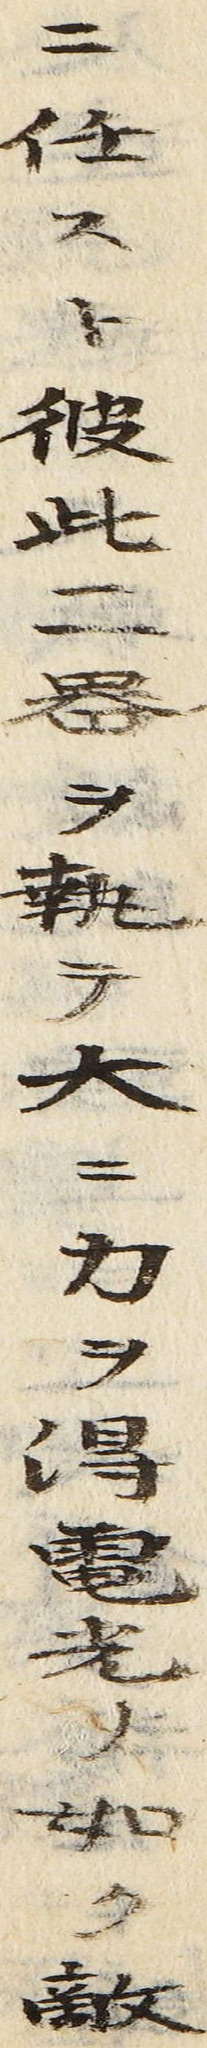ニ任スト彼此二器ヲ執テ大ニ力ヲ得電光ノ如ク敵
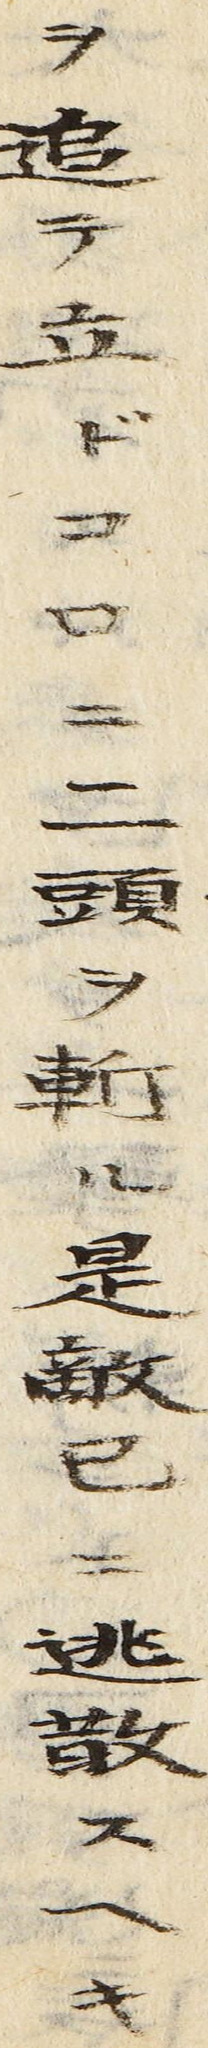ヲ追テ立ドコロニ二頭ヲ斬ル是敵已ニ逃散スヘキ
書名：漂流紀事
